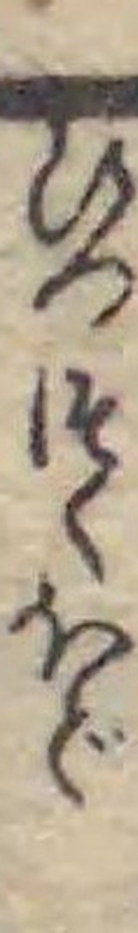ひつつくほど
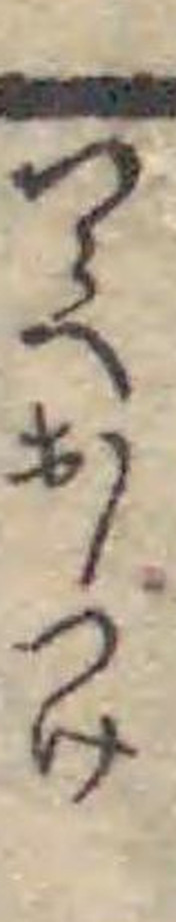つらへおしつけ
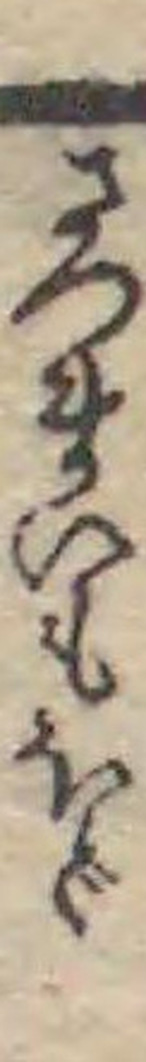さつまいもほど
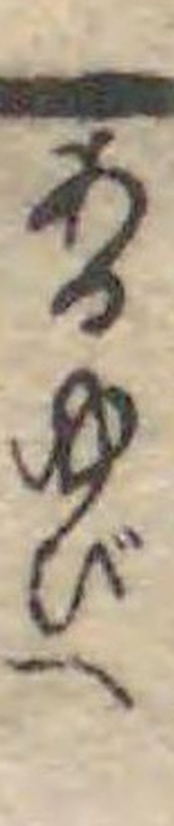あるゆびへ
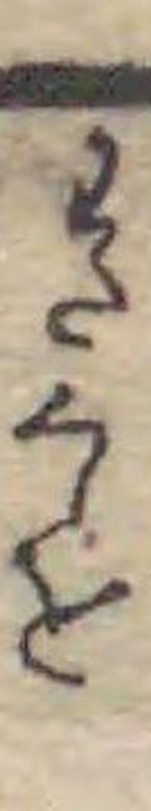わたくしを
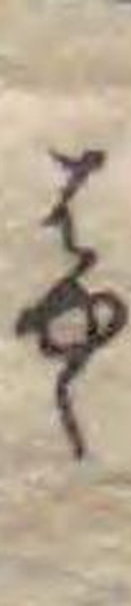はやく
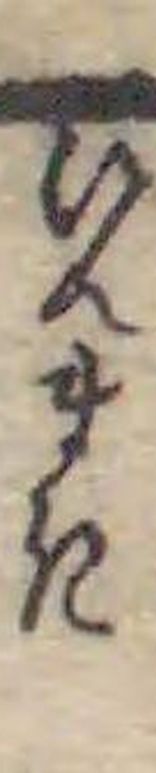ひんまき
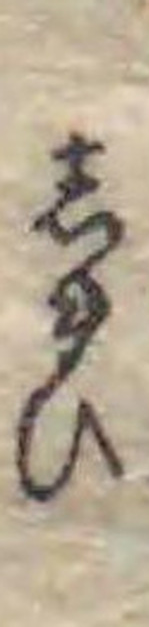しまひ
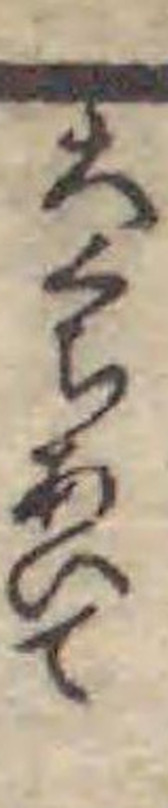大くちあいて
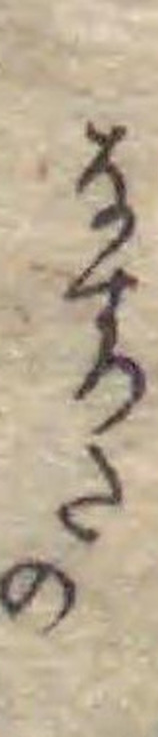なすつたの
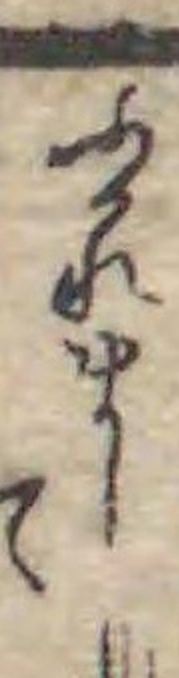ふかれまして
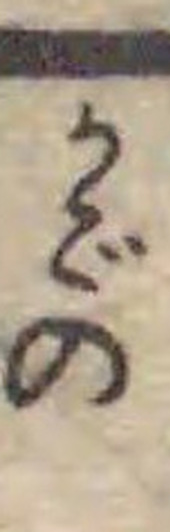かごの
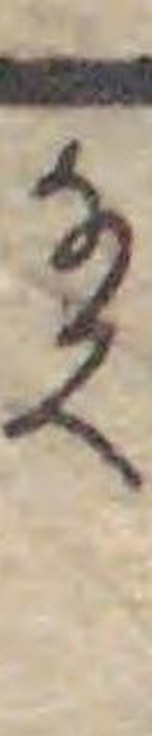なかへ
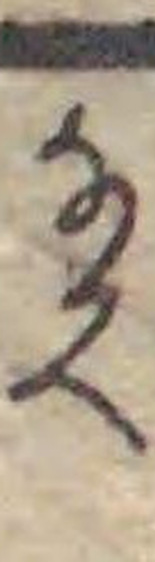なかへ
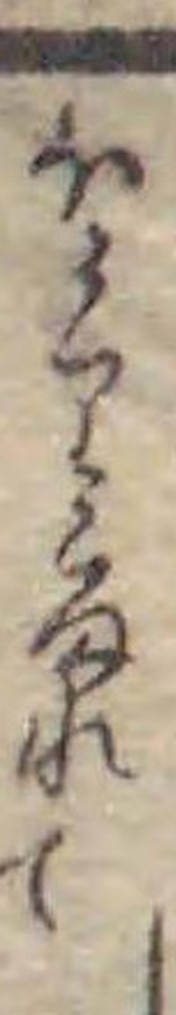ほうりこまれて
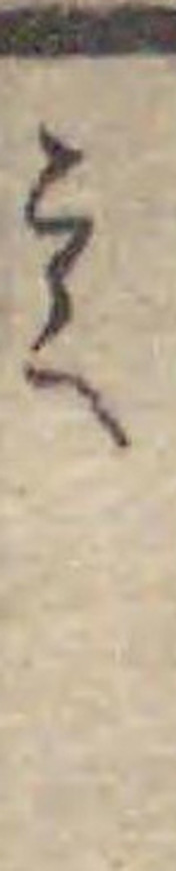こゝへ
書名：紙屑身上噺 : 3巻
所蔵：国立国会図書館 National Diet Library, JAPAN
